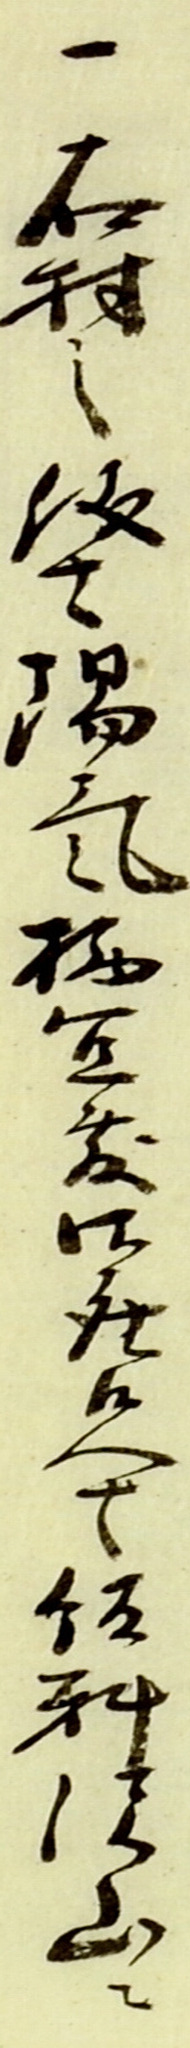一右村之儀者陽気栖宜敷御座候へ者飯料沢山ニ
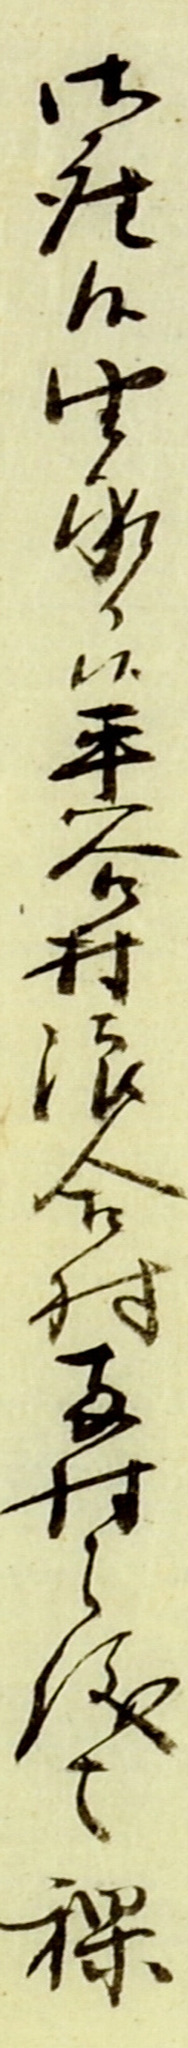御座候由承り候平谷村浪合村両村之儀者稞
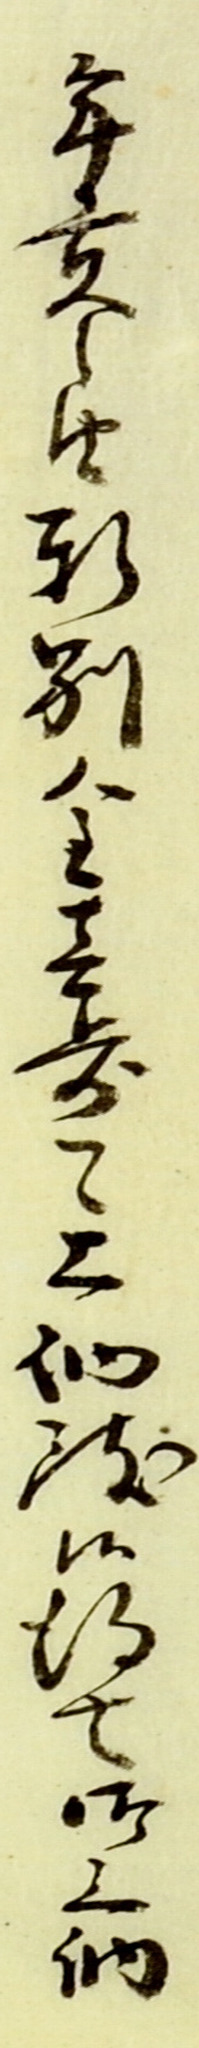年貢之由軒別金壱歩ツヽ上納致候得者御上納
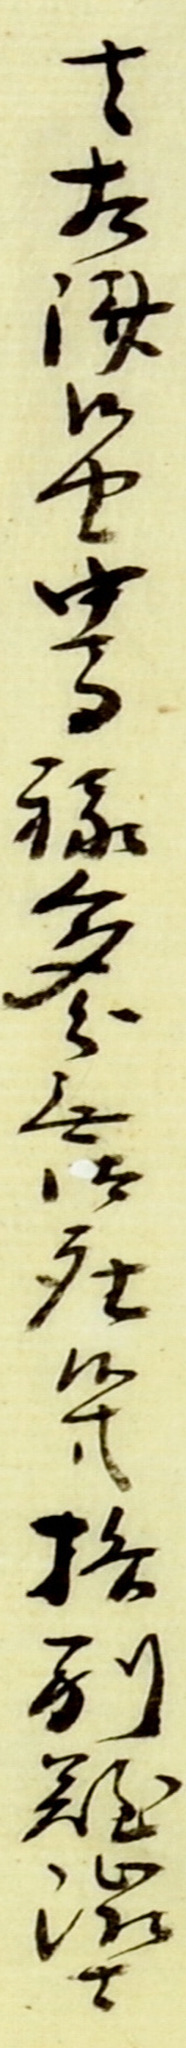者相済候由中馬禄多分無御座候共格別難渋者

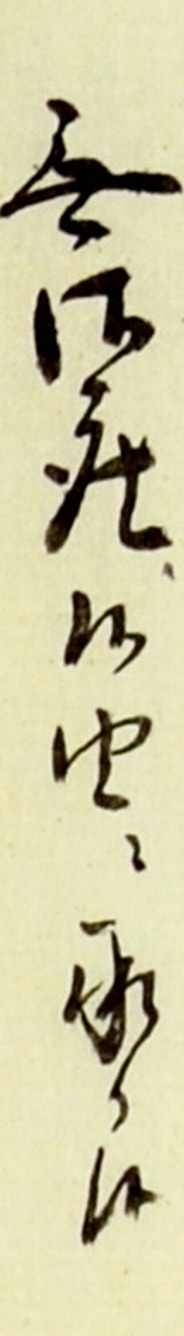無御座候由ニ承り候
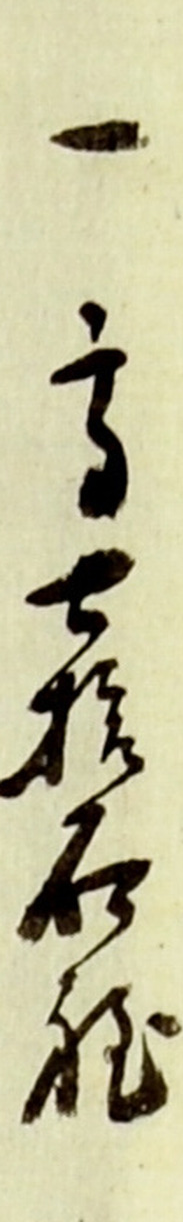一高七拾石程
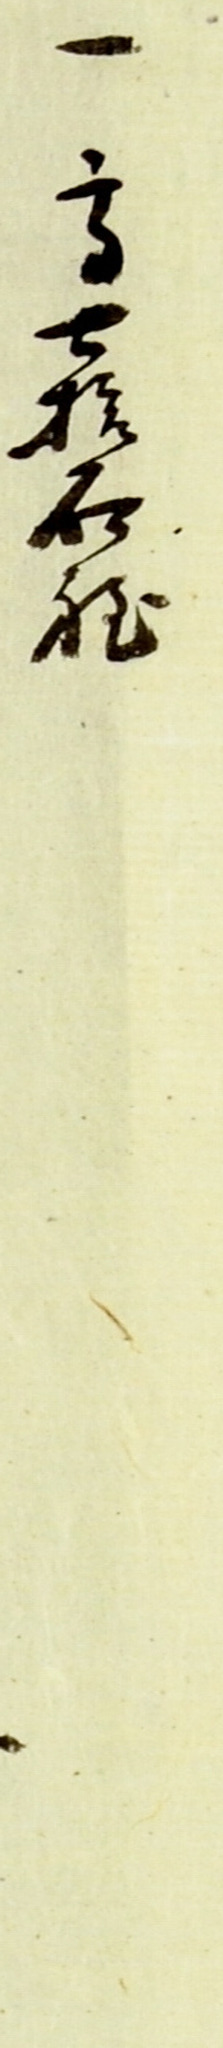一高七拾石程
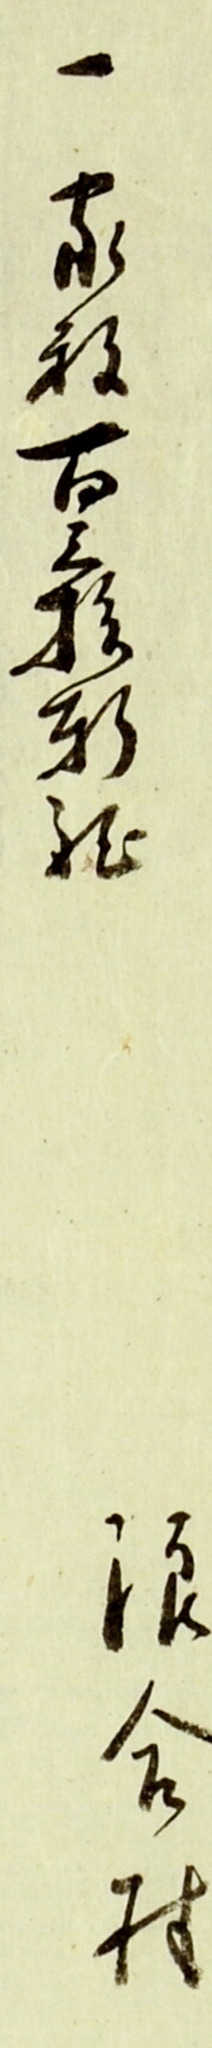一家数百三拾軒程浪合村
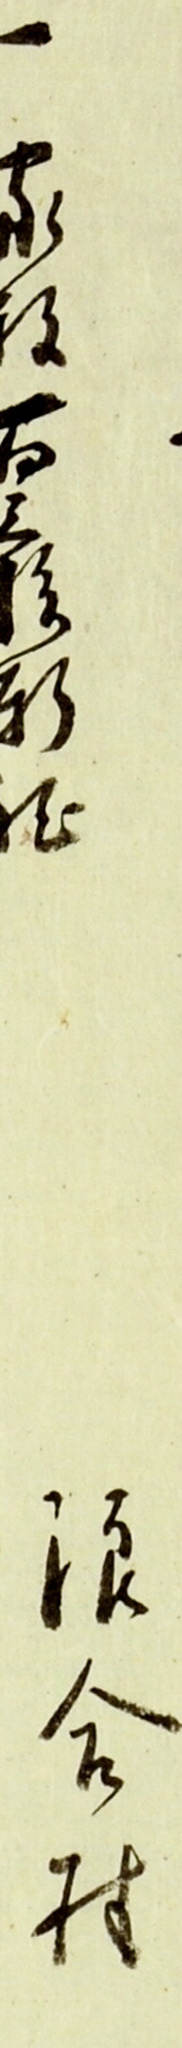一家数百三拾軒程浪合村
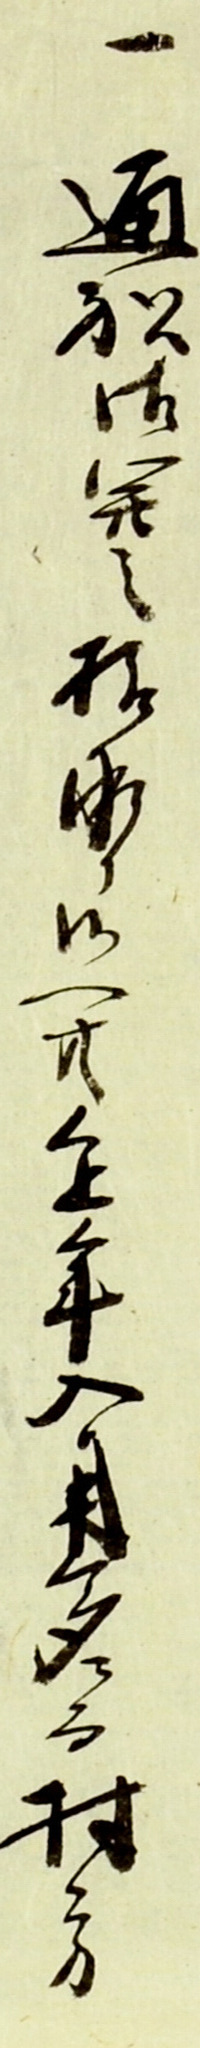一通船御開之様承り候へ共近年入用多ニ而村方
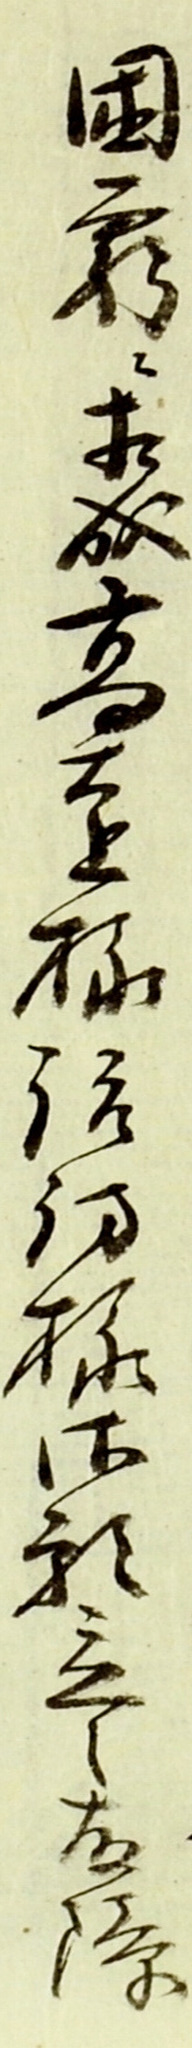困窮ニ相成高遠様諏訪様御願立之故障
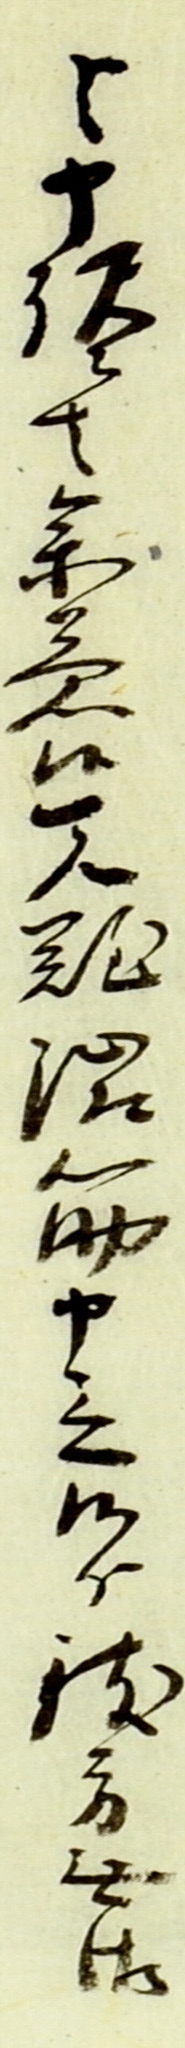は申訳ニは参着候一人難渋筋申立候ゟ致方無御
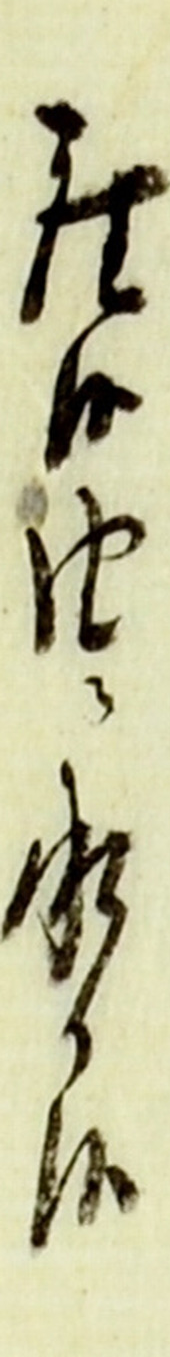座候由ニ承り候
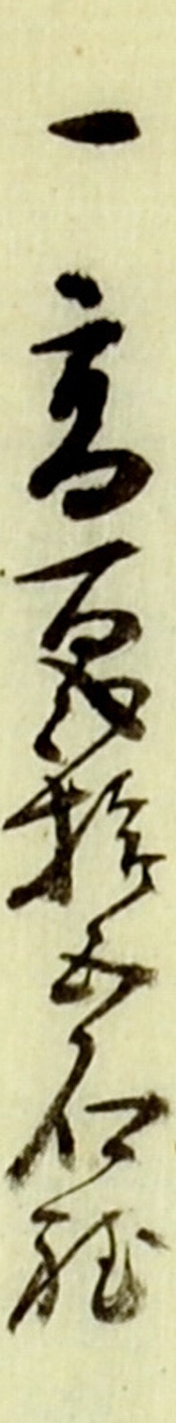一高百弐拾五石程
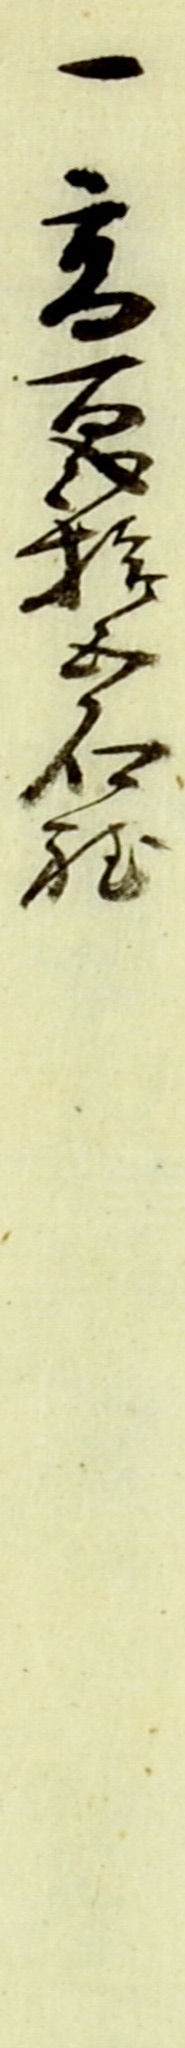一高百弐拾五石程
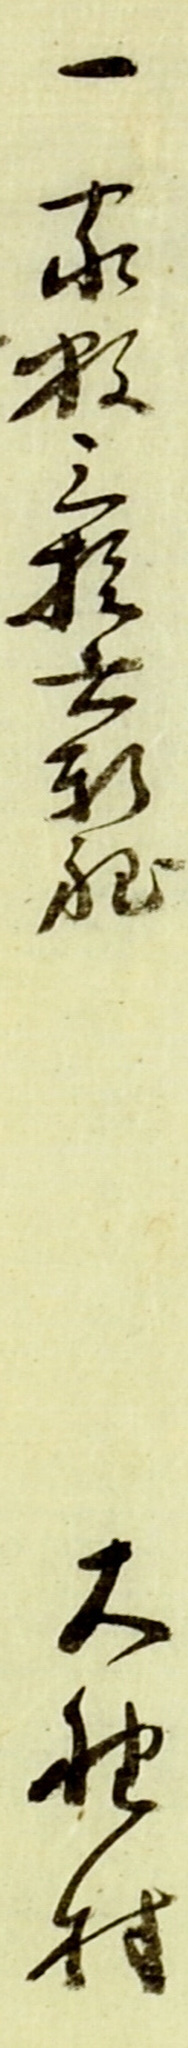一家数三拾六軒程大野村
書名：調査報告書
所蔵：伊那市立高遠町図書館・合同会社AMANE
